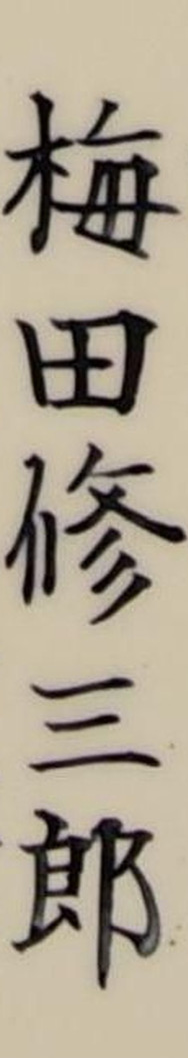梅田修三郎
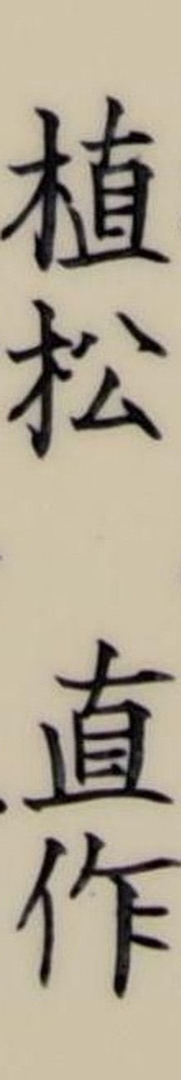植松直作
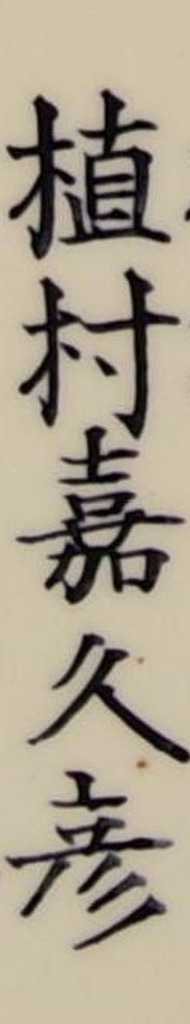植村嘉久彦
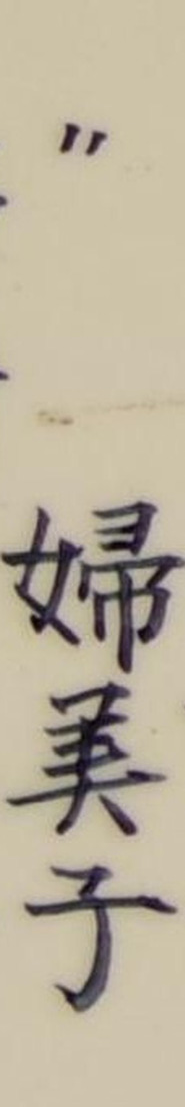婦美子
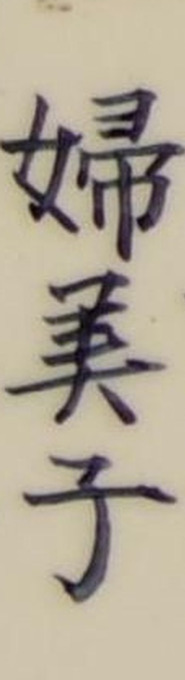婦美子
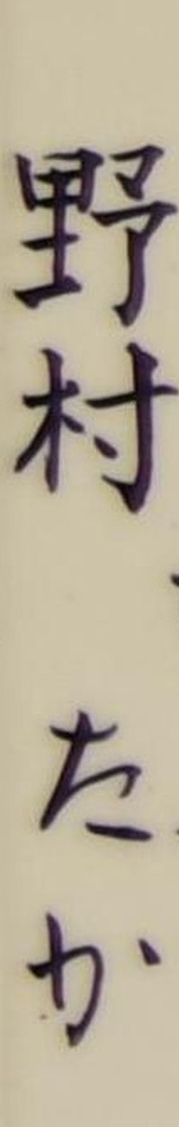野村たか

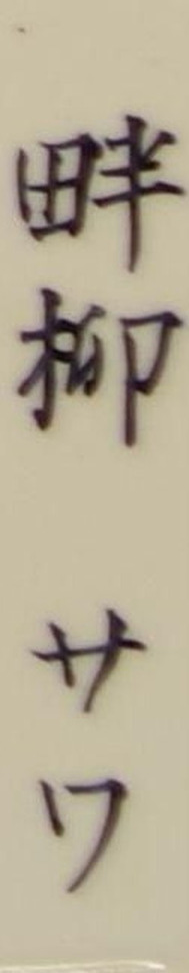畔柳サワ
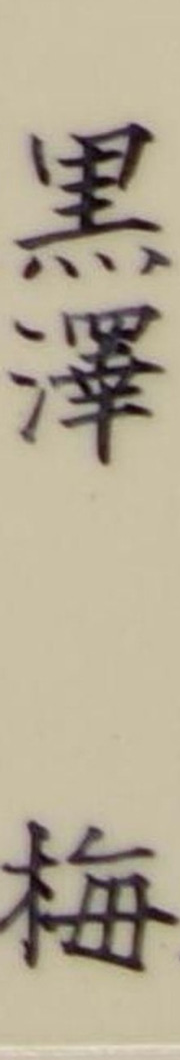黒澤梅
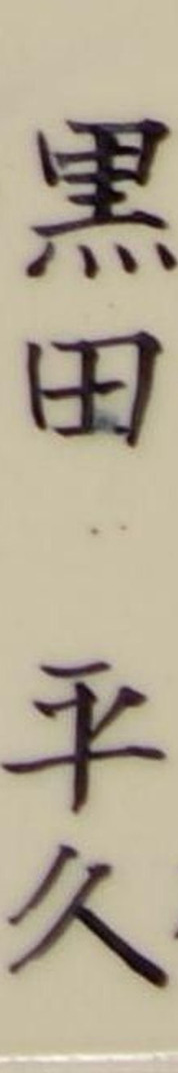黒田平久
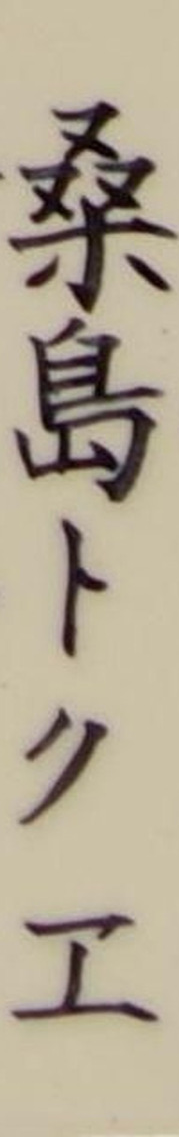桑島トクエ
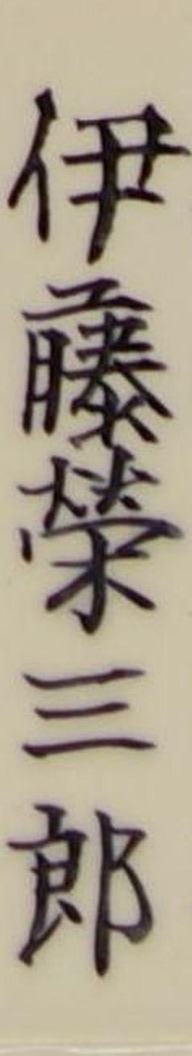伊藤榮三郎
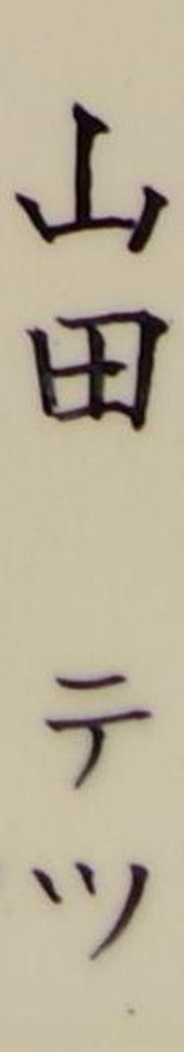山田テツ
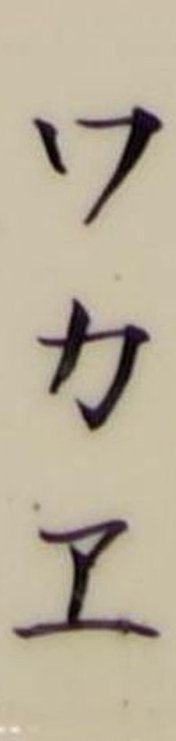ワカエ
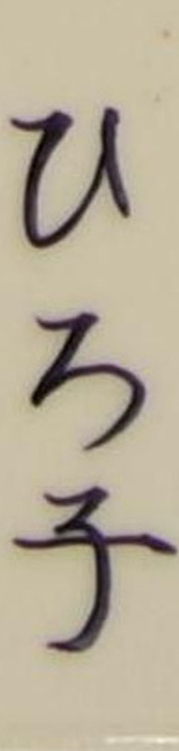ひろ子
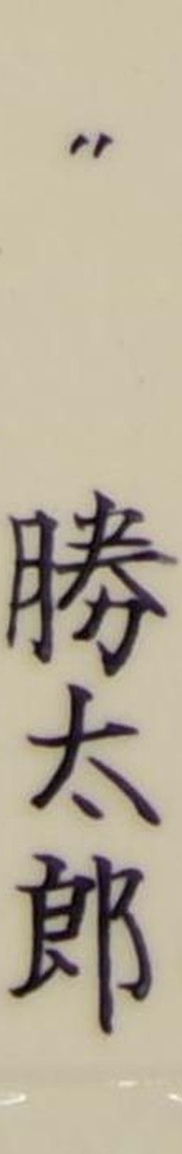勝太郎
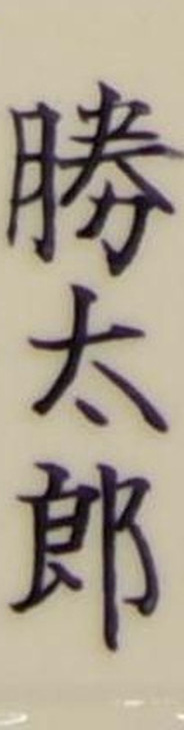勝太郎
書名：A~D
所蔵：koyasan kongobuji
